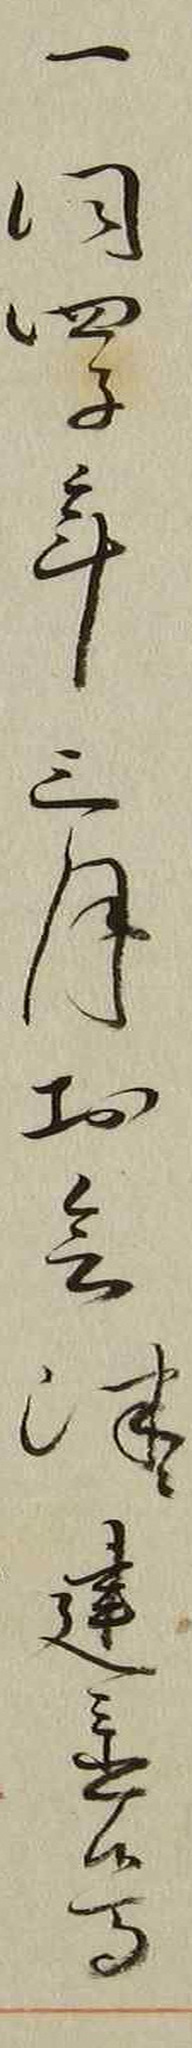一同四子年三月於会津ニ建置候馬
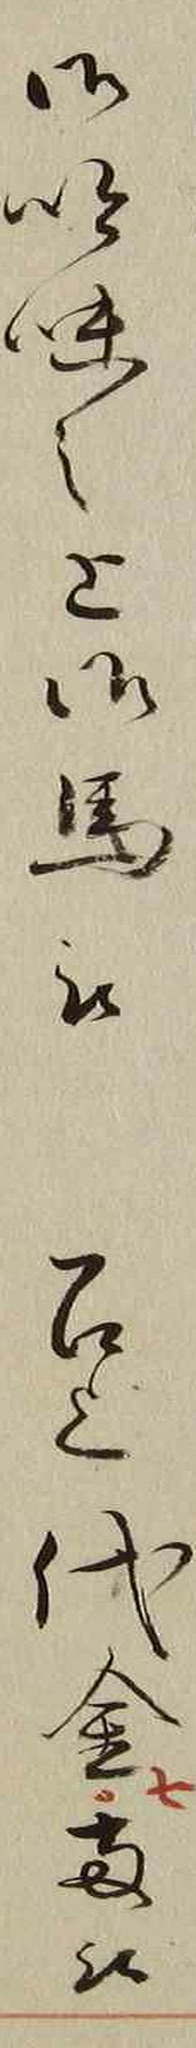御吟味之上御馬被召上代金七両被
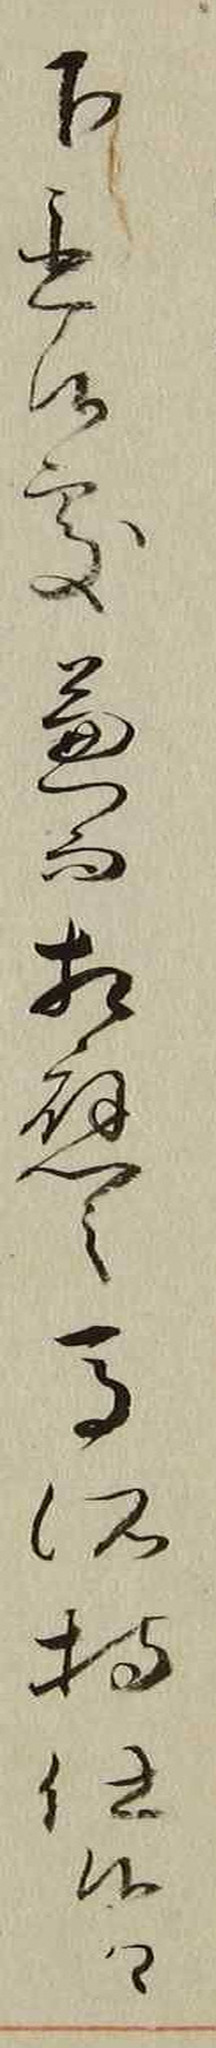下置候処兼而相応之馬所持仕候ハヽ
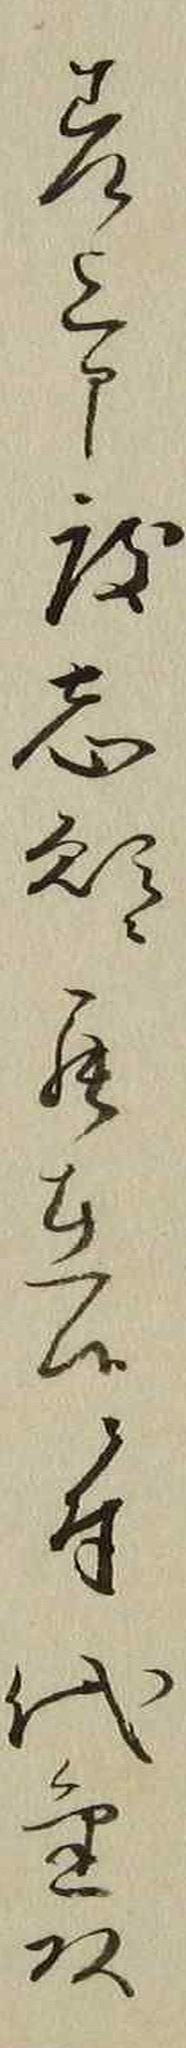差上申度志願ニ罷在候ニ付代金頂
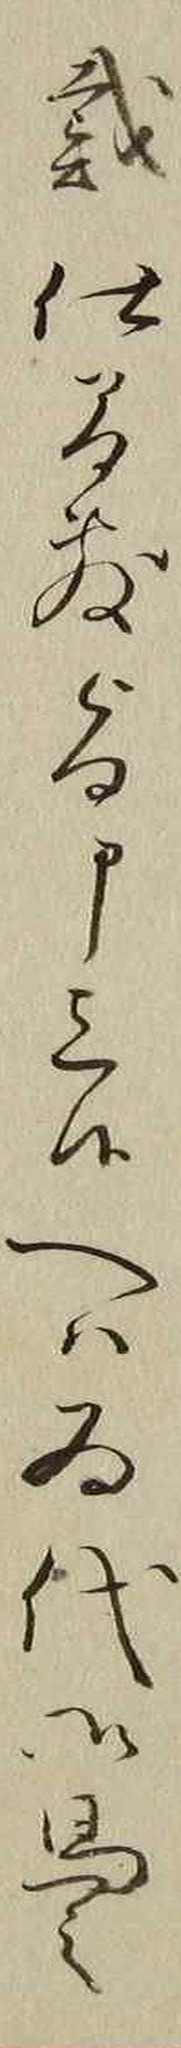戴仕間敷旨申上候ヘハ為代御馬之
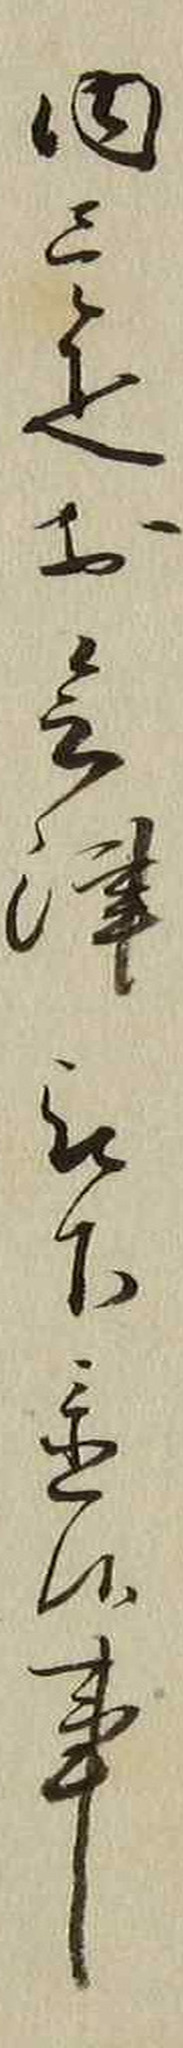内三日疋於会津被下置候事
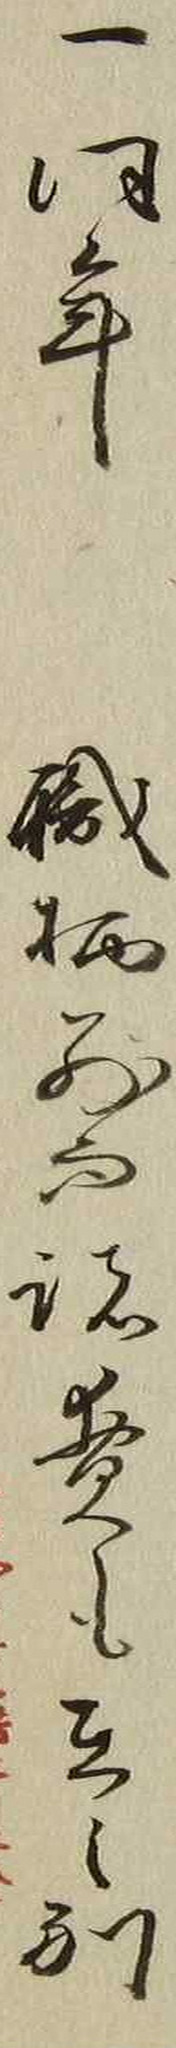一同年職柄別而諸費も在之別
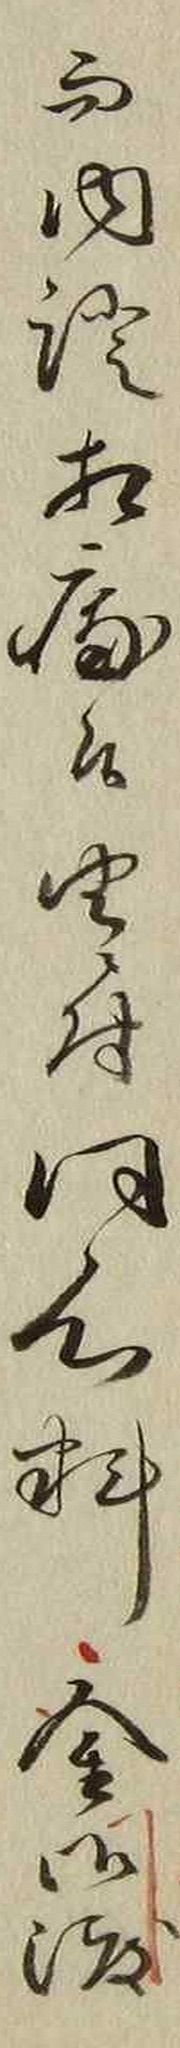而内証相痛候由ニ付同心料・金御渡
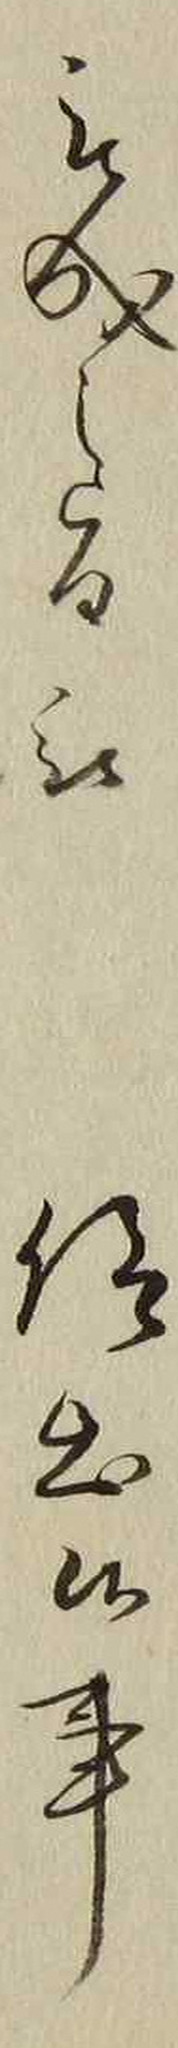被成之旨被仰出候事
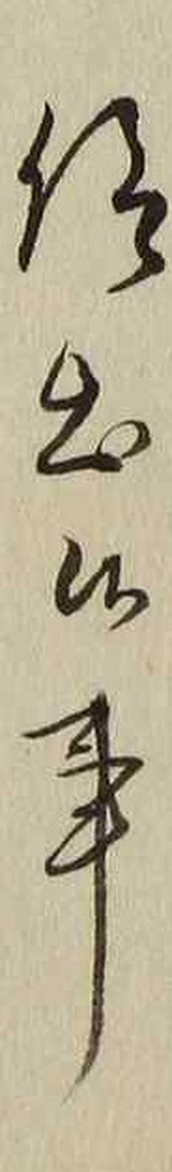仰出候事
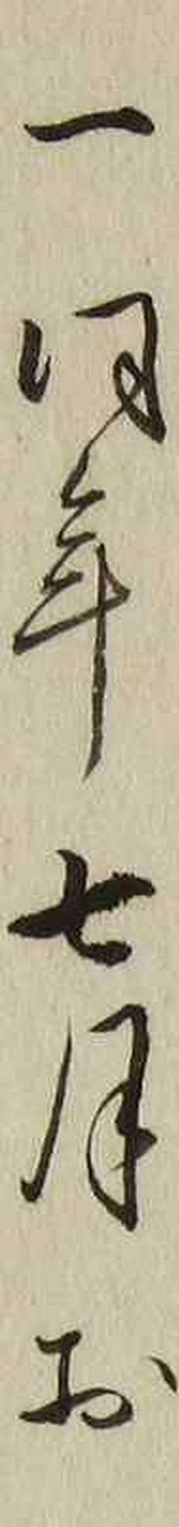一同年七月於
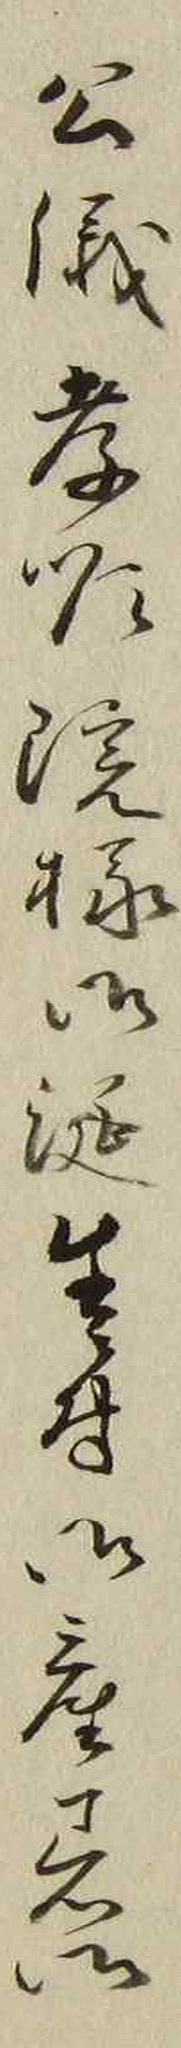公儀孝順院様御誕生ニ付御産着御
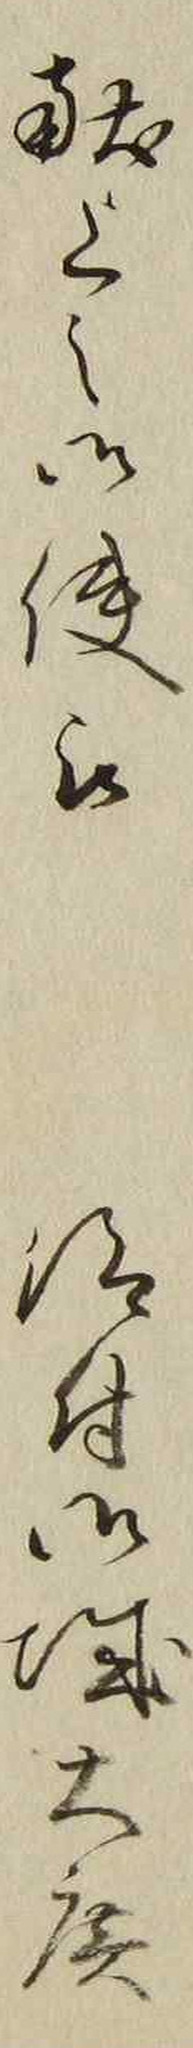献上之御使被仰付御城大広
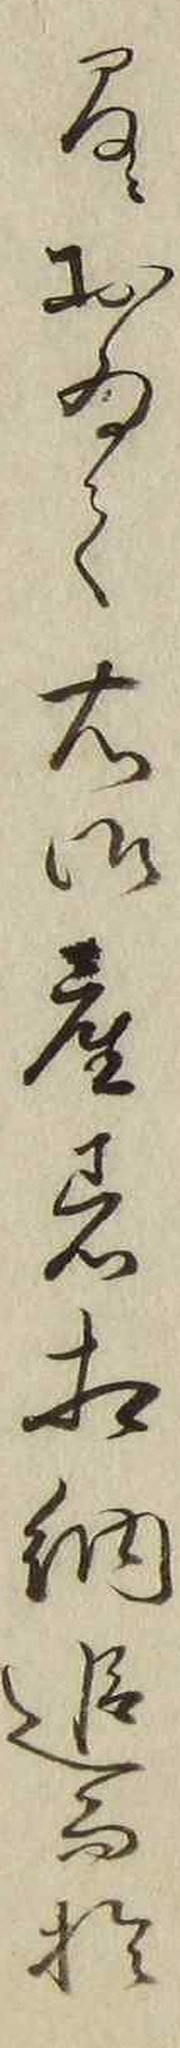間ニおゐて右御産着相納追而於

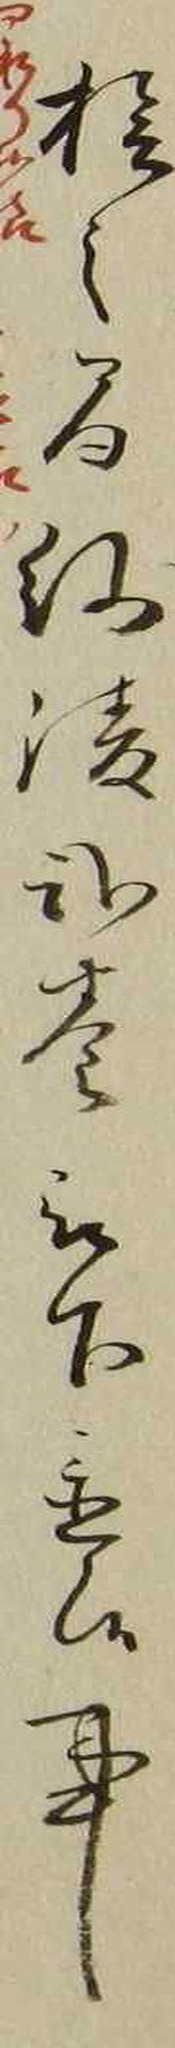桧之間紗綾弐巻被下置候事
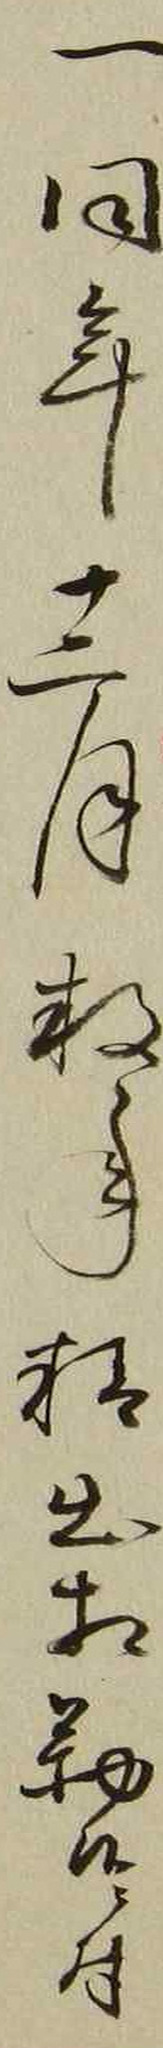一同年十二月数年精出相勤候ニ付
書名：諸士系譜　巻之2　い之部2
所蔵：会津若松市立会津図書館
